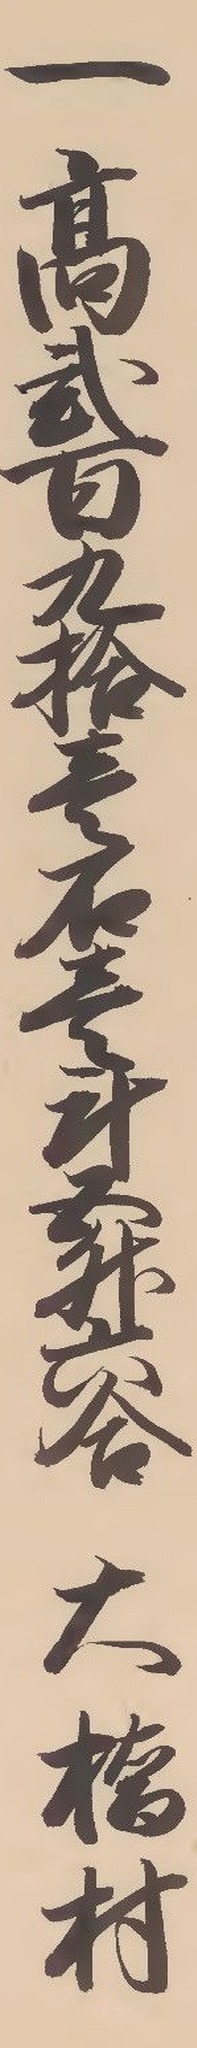一高弐百九拾壱石壱斗五升六合大橋村
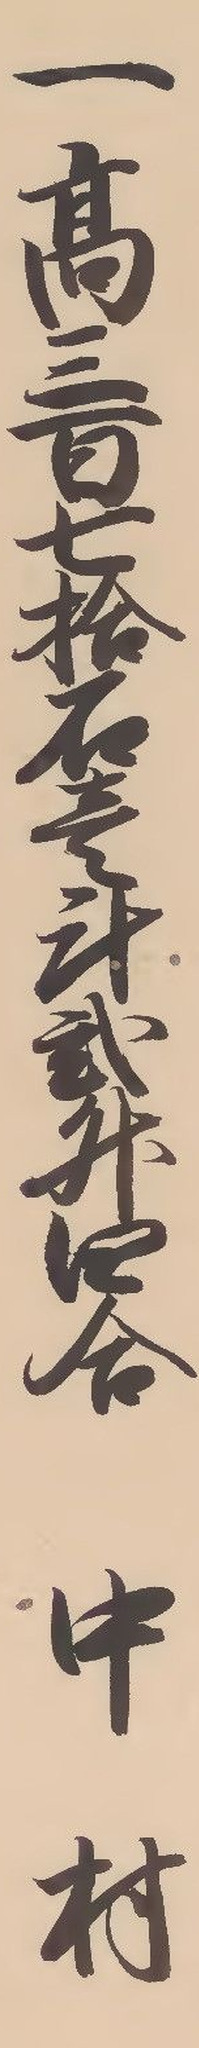一高三百七拾石壱斗弐升四合中村

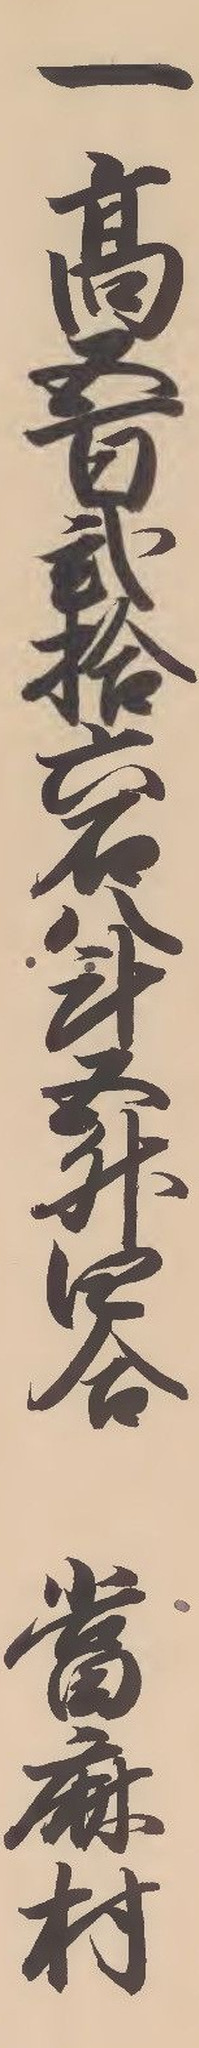一高五百弐拾六石八斗五升四合当麻村
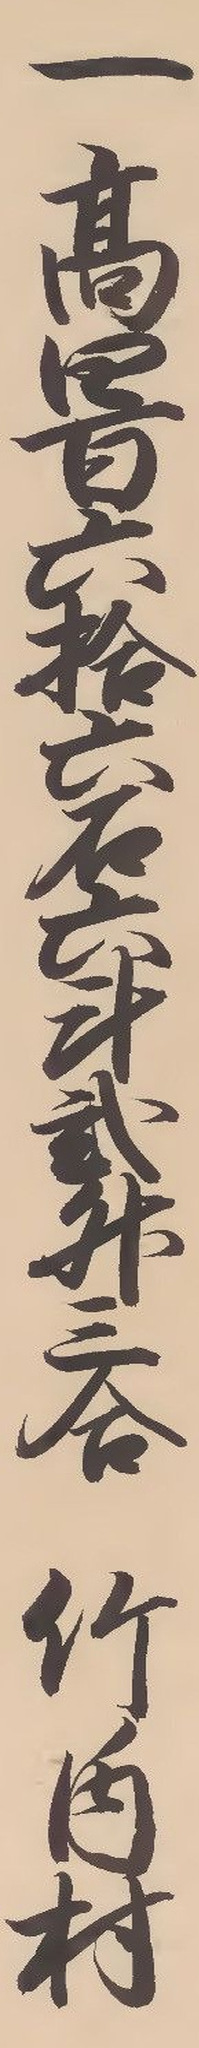一高四百六拾六石六斗弐升三合竹ノ内村
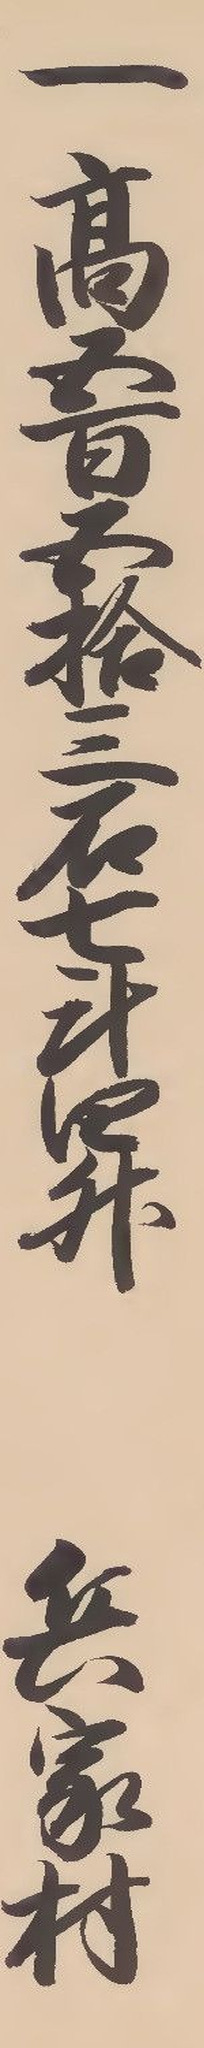一高五百五拾三石七斗四升兵家村
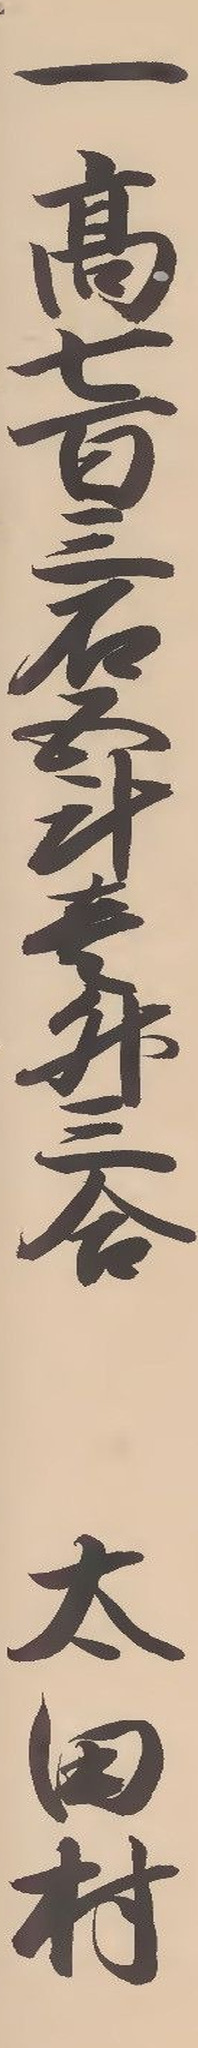一高七百三石五斗壱升三合太田村
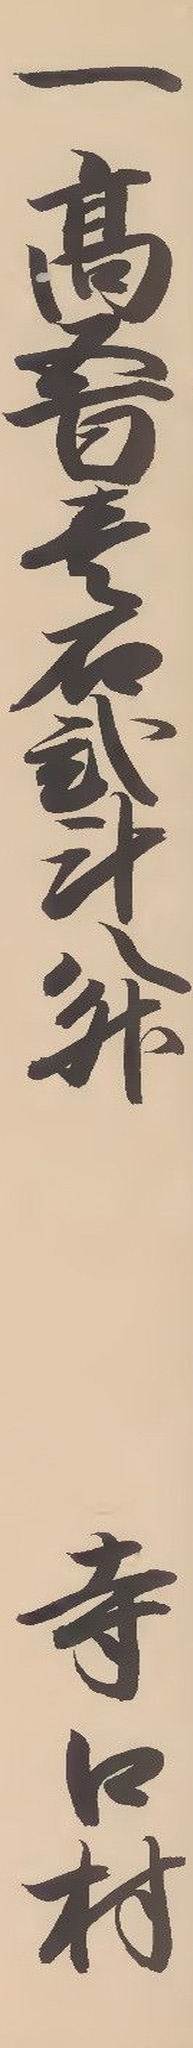一高五百壱石弐斗八升寺口村
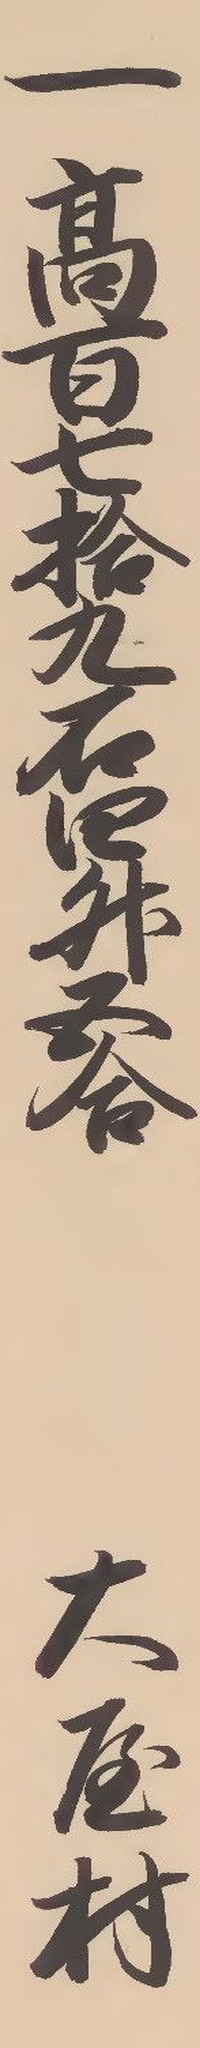一高百七拾九石四升五合大屋村
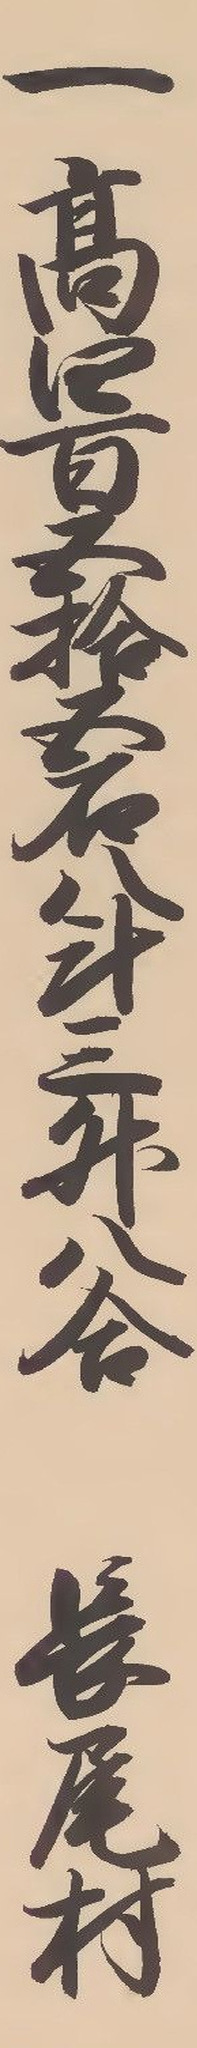一高四百五拾五石八斗三升八合長尾村
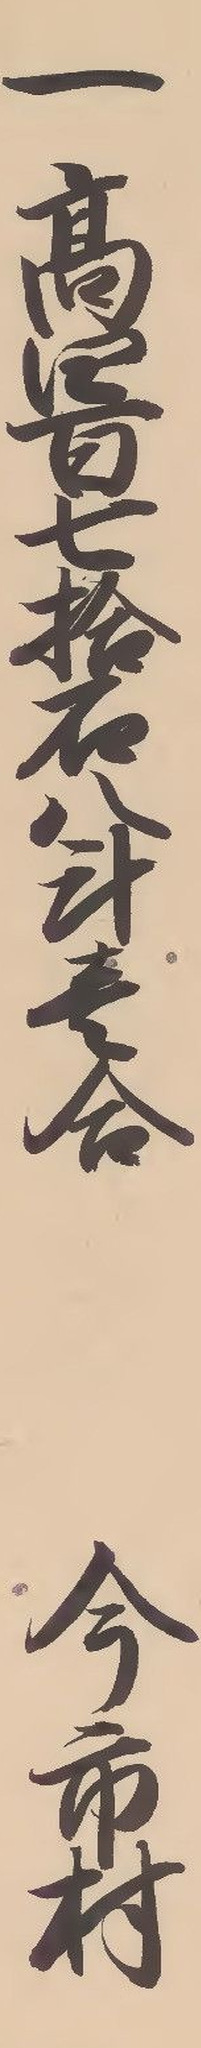一高四百七拾石八斗壱合今市村

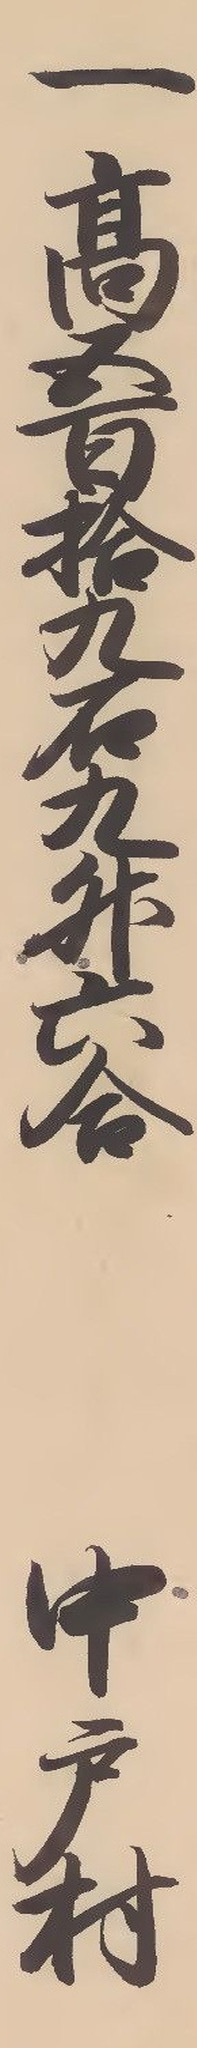一高五百拾九石九升六合中戸村
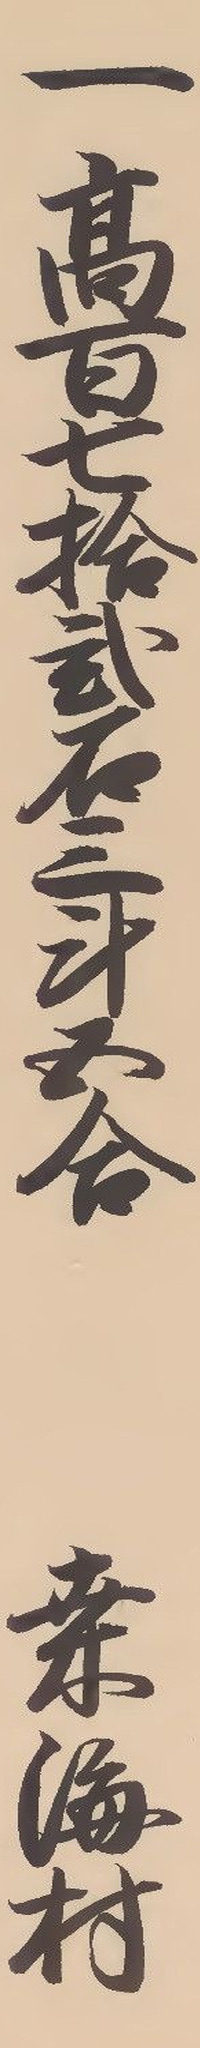一高百七拾弐石三斗五合桑海村
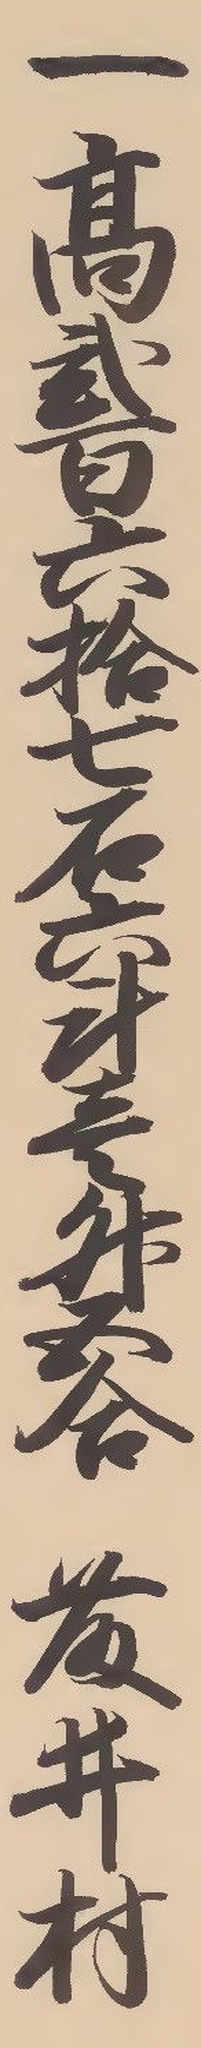一高弐百六拾七石六斗壱升五合藤井村
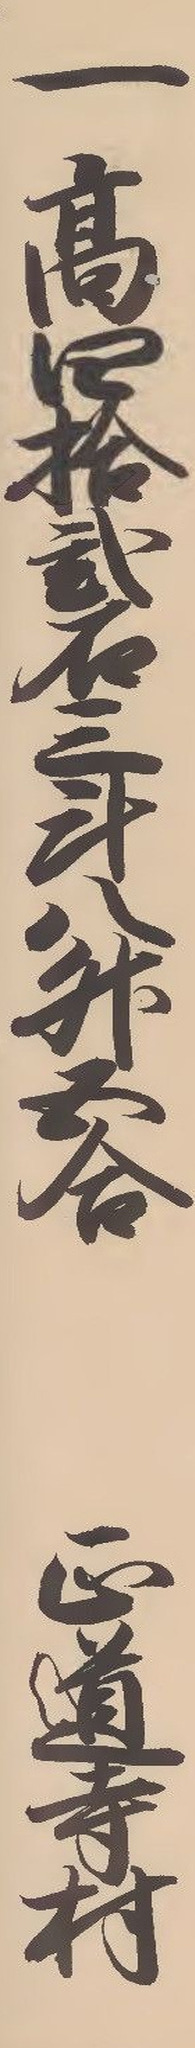一高四拾弐石三斗八升五合正道寺村
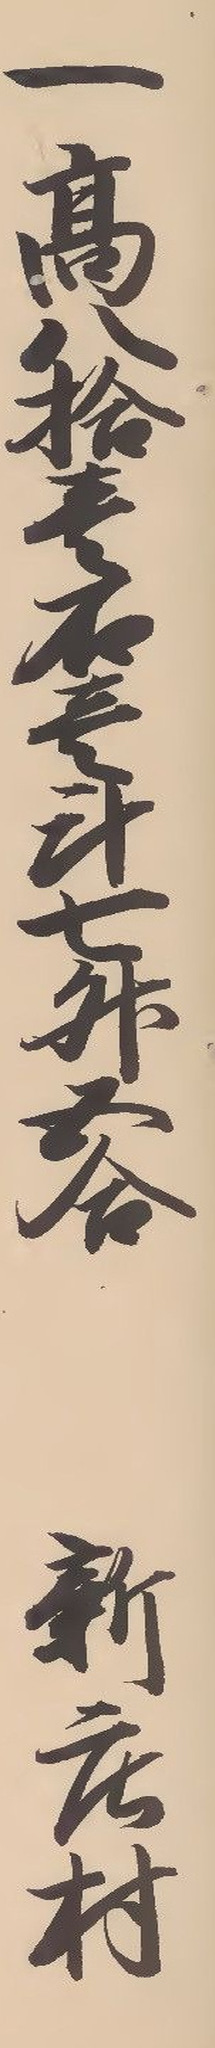一高八拾壱石壱斗七升五合新庄村
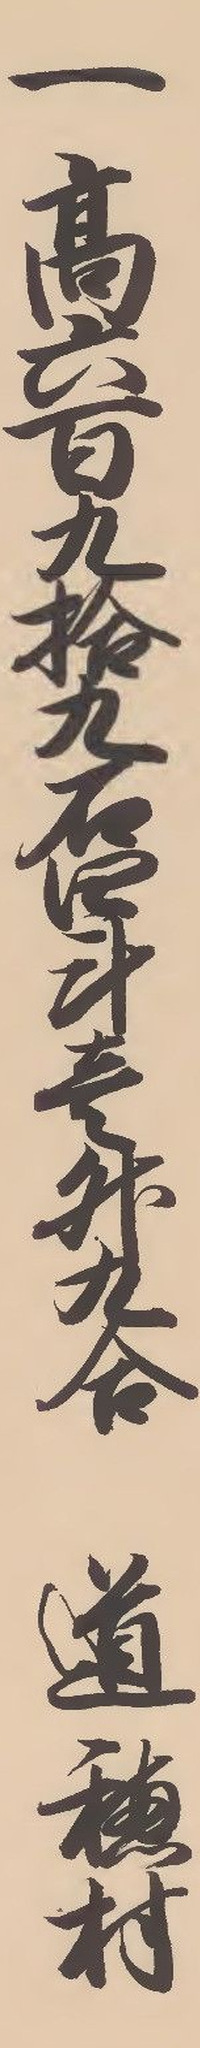一高六百九拾九石四斗壱升九合道穂村
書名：大和国郷帳
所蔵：国立公文書館 National Archives of Japan
